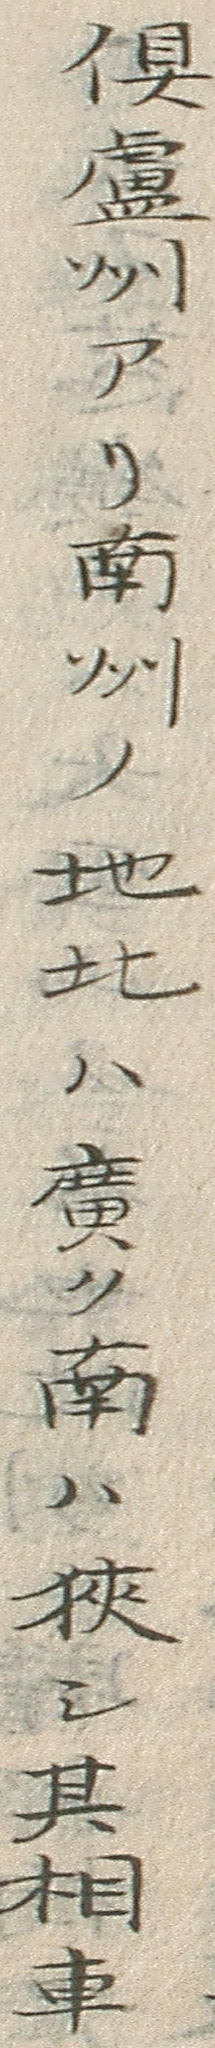倶盧州アリ南州ノ地北ハ広ク南ハ狭シ其相車
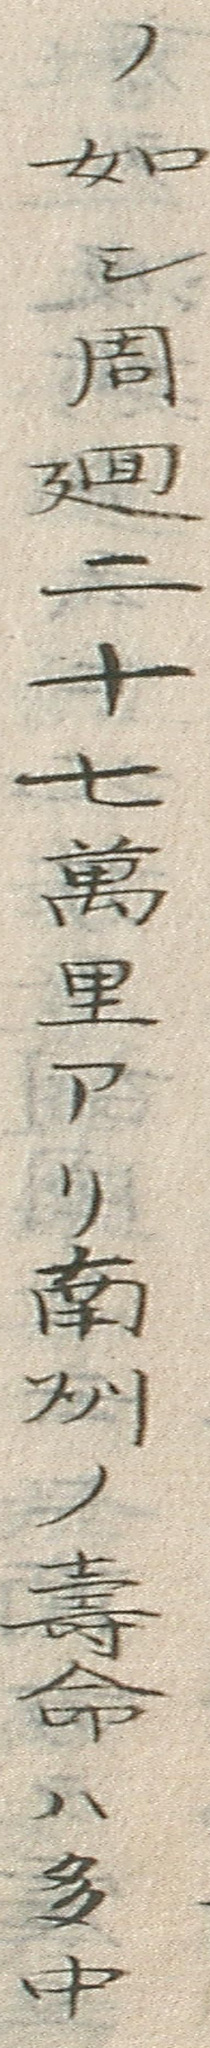ノ如シ周廻二十七万里アリ南州ノ寿命ハ多中
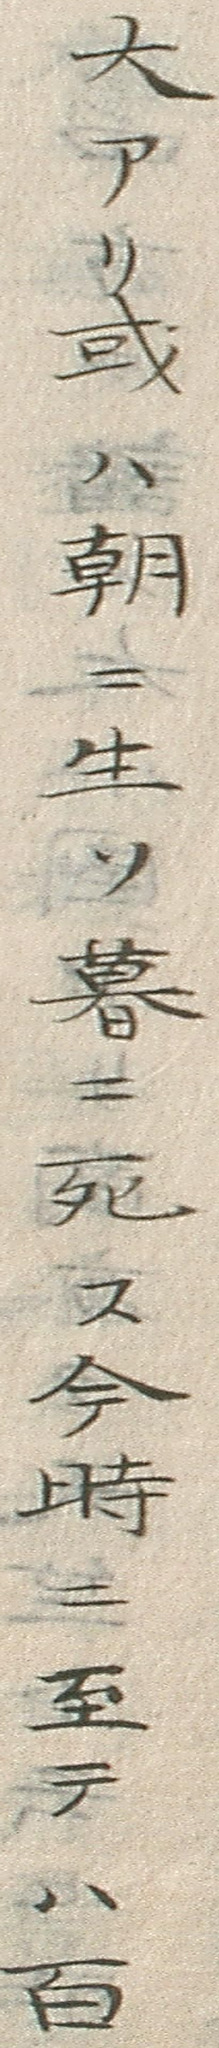大アリ或ハ朝ニ生ソ暮ニ死ス今時ニ至テハ百
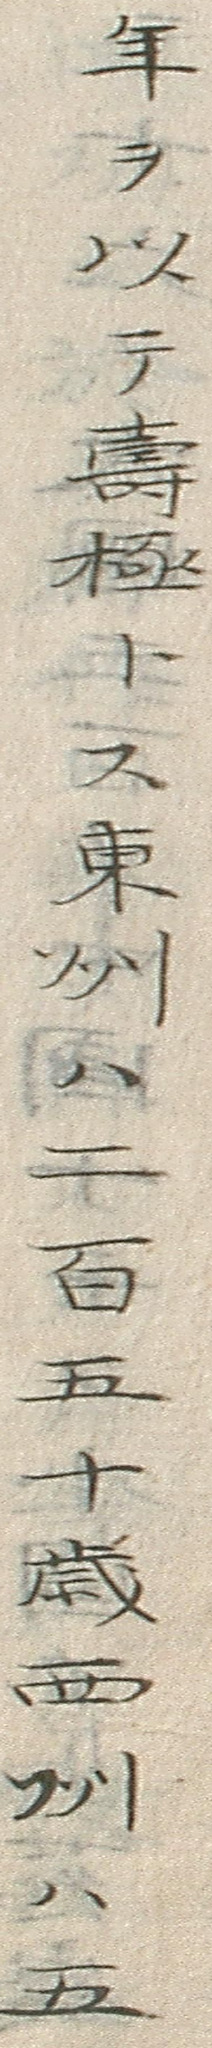年ヲ以テ寿極トス東州ハ二百五十歳西州ハ五
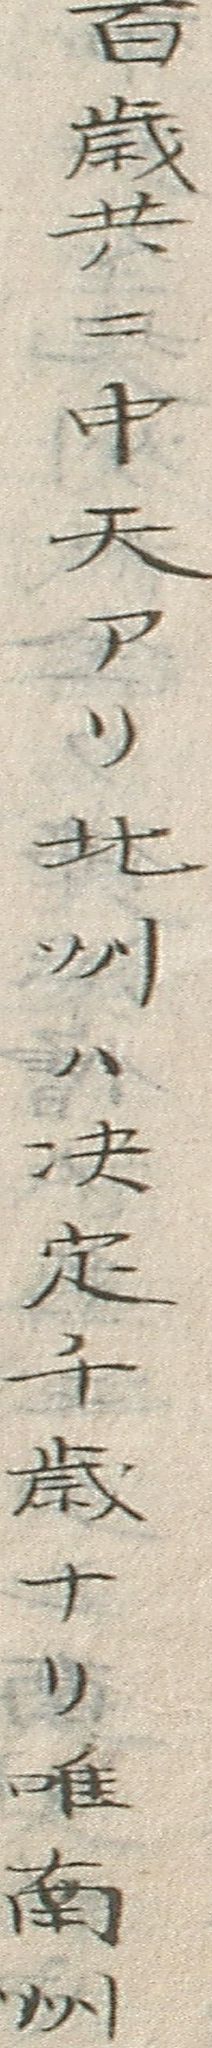百歳共ニ中天アリ北州ハ決定千歳ナリ唯南州
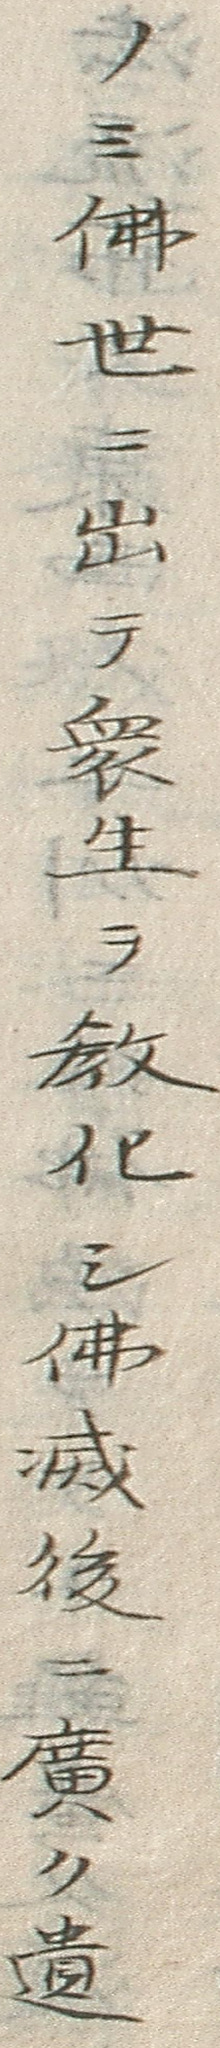ノミ仏世ニ出テ衆生ヲ教化シ仏滅後ニ広ク遺

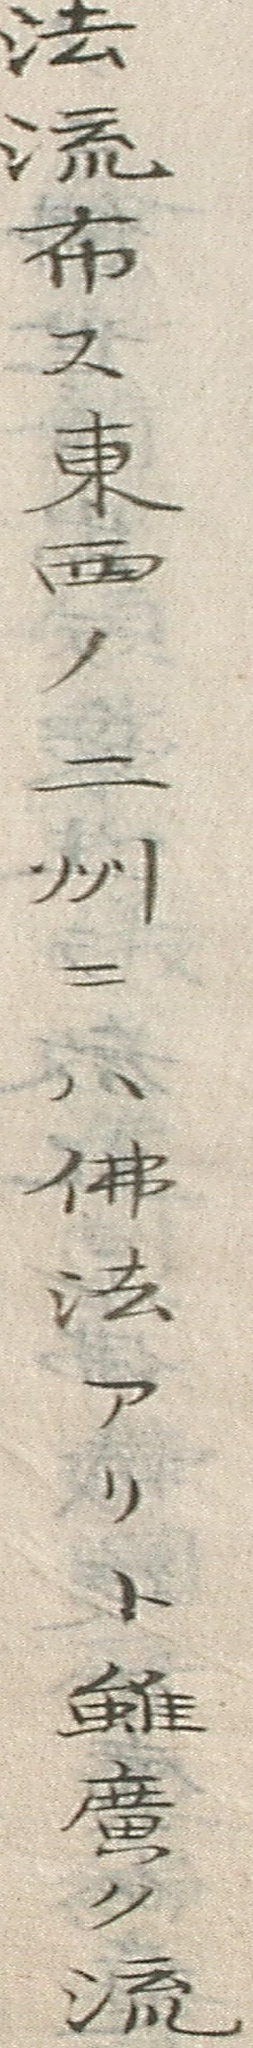法流布ス東西ノ二州ニハ仏法アリト雖広ク流
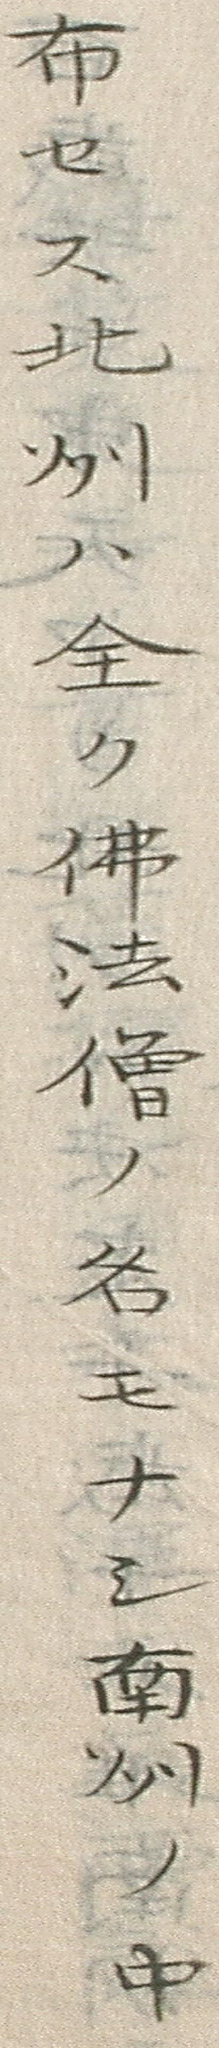布セス北州ハ全ク仏法僧ノ名モナシ南州ノ中
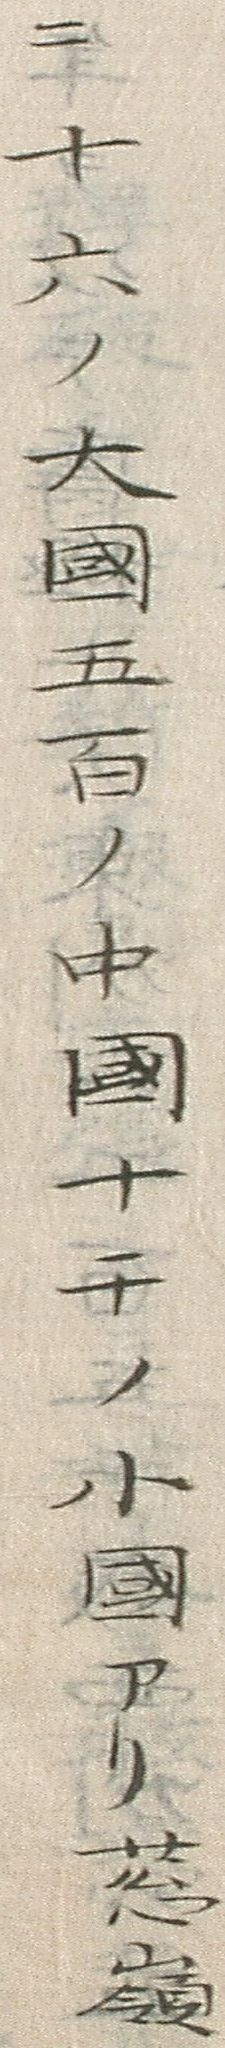ニ十六ノ大国五百ノ中国十千ノ小国アリ蕊嶺
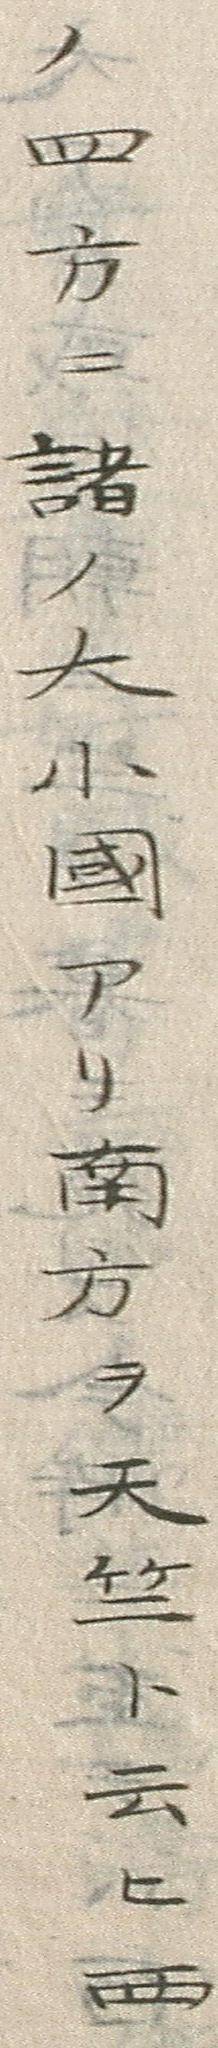ノ四方ニ諸ノ大小国アリ南方ヲ天竺ト云ヒ西
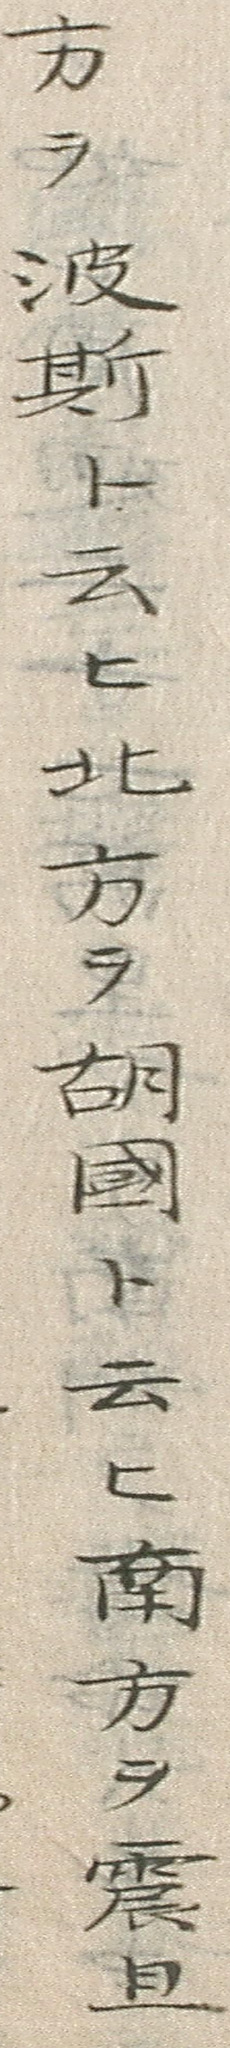方ヲ波斯ト云ヒ北方ヲ胡国ト云ヒ南方ヲ震旦
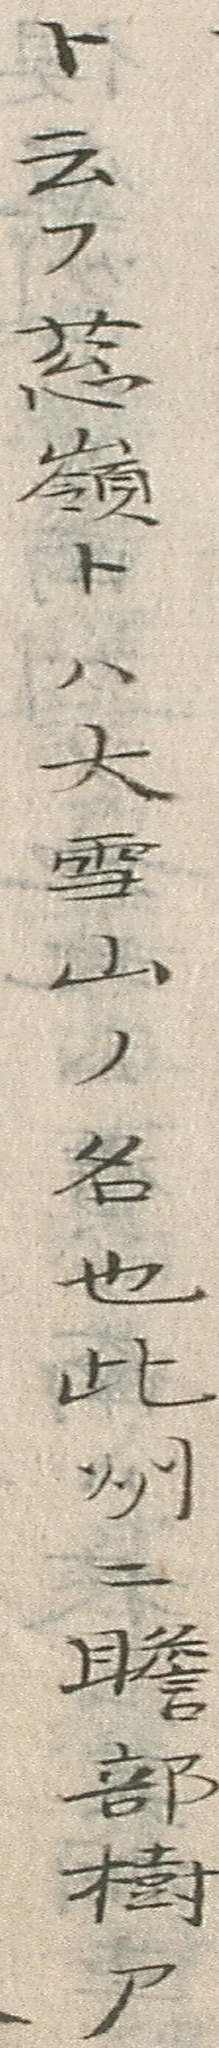ト云フ蕊嶺トハ大雪山ノ名也此州ニ贍部樹ア
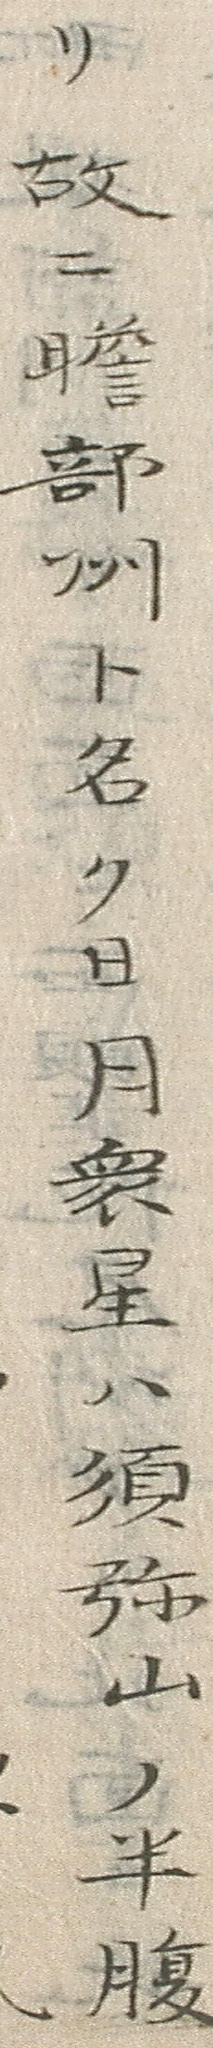リ故ニ贍部州ト名ク日月衆星ハ須弥山ノ半腹
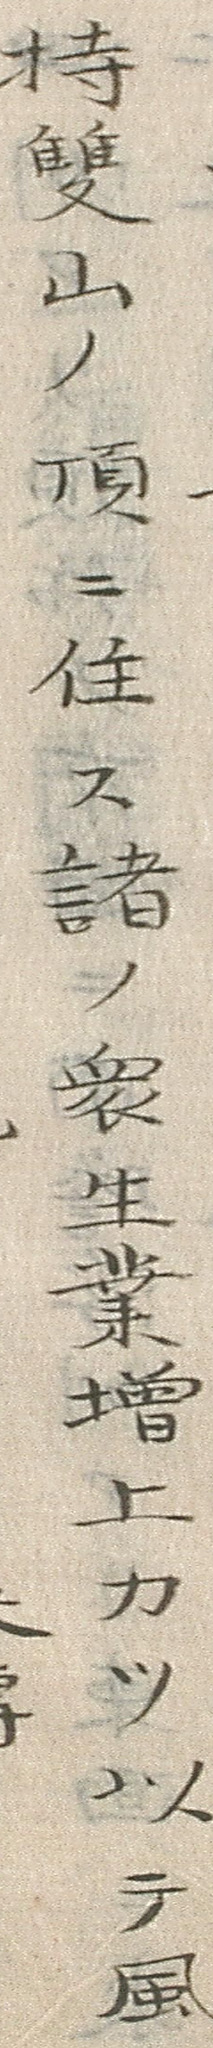持双山ノ頂ニ住ス諸ノ衆生業増上カツ以テ風
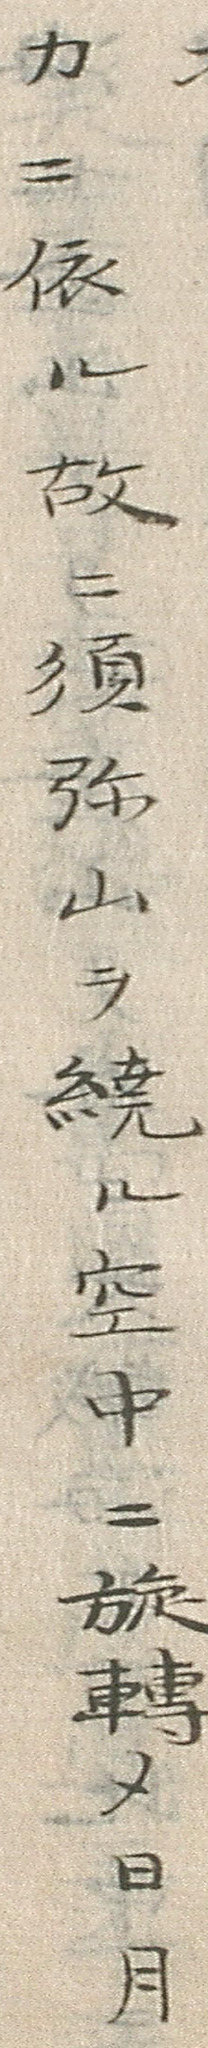力ニ依ル故ニ須弥山ヲ繞ル空中ニ旋転シテ日月
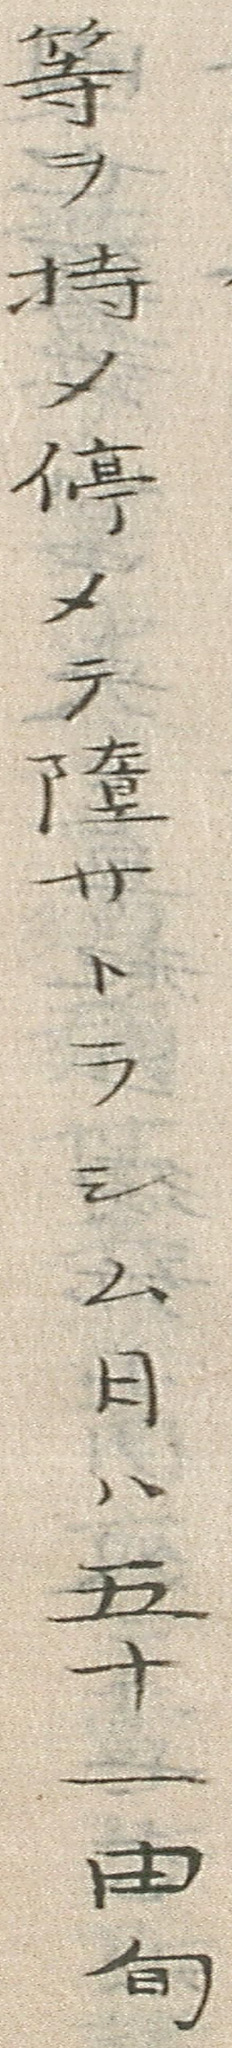等ヲ持シテ停メテ堕サトラシム月ハ五十一由旬
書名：天學略名目羽翼　全
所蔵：東京大学地震研究所図書室 Earthquake Research Institute Library, The University of Tokyo, JAPAN
